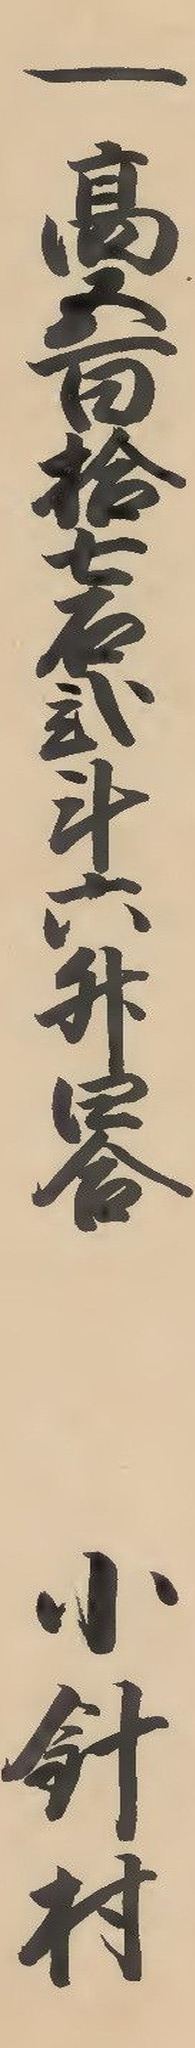一高五百拾七石弐斗六升四合小針村
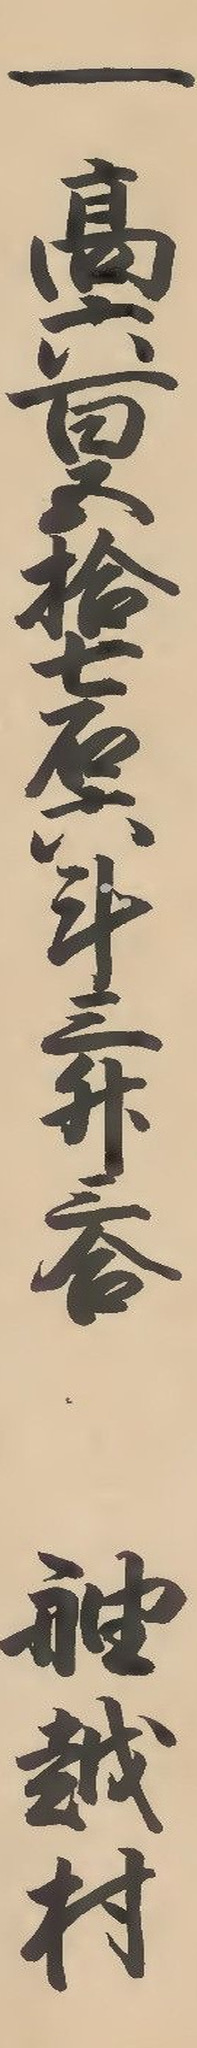一高六百五拾七石六斗三升三合舳越村
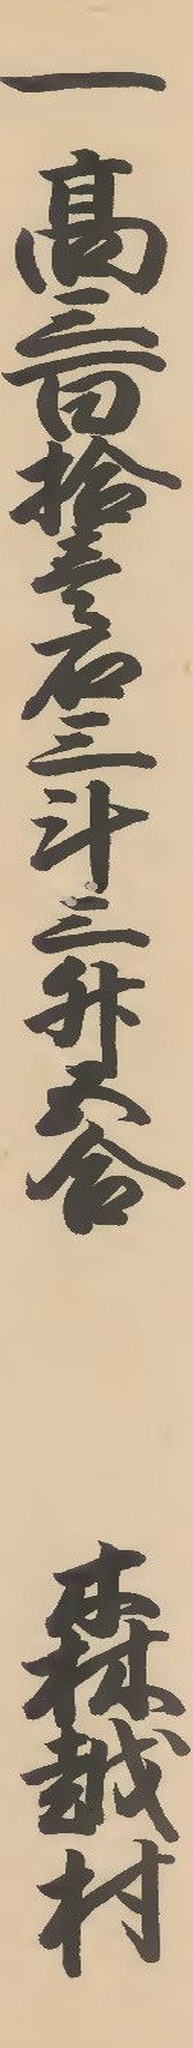一高三百拾壱石三斗三升五合森越村
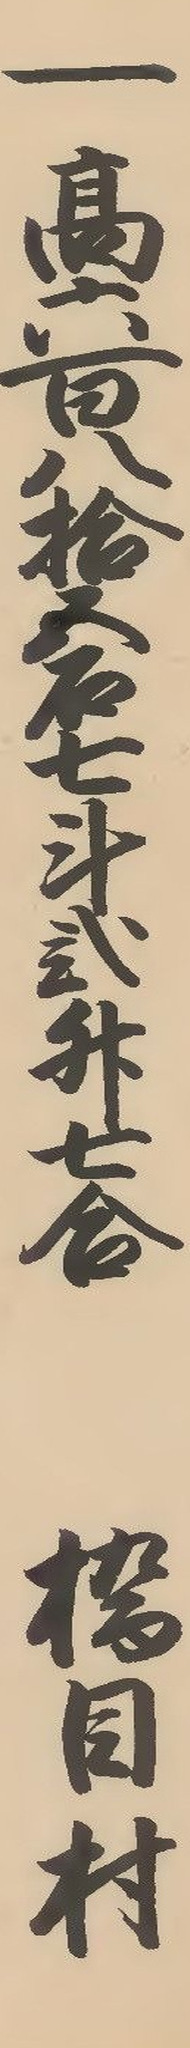一高六百八拾五石七斗弐升七合橋目村
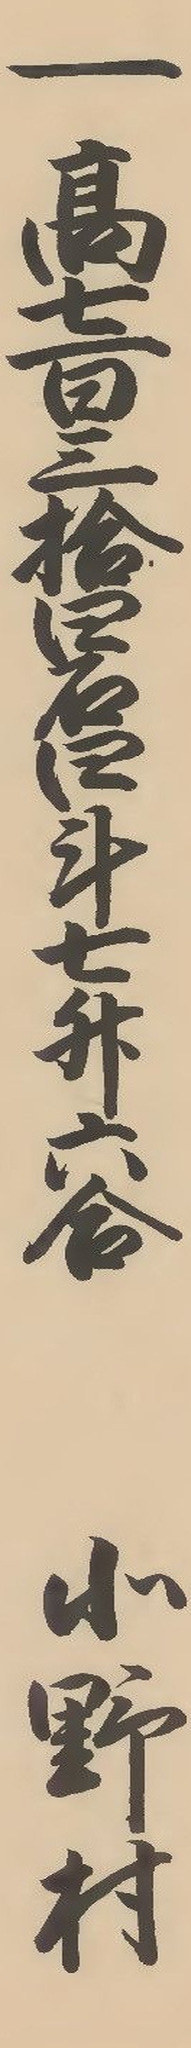一高七百三拾四石四斗七升六合北野村
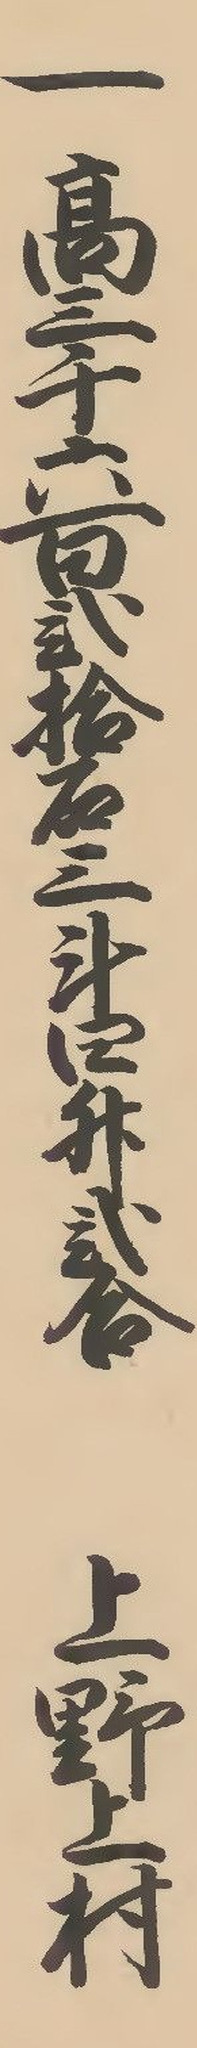一高三千六百弐拾石三斗四升弐合上野上村

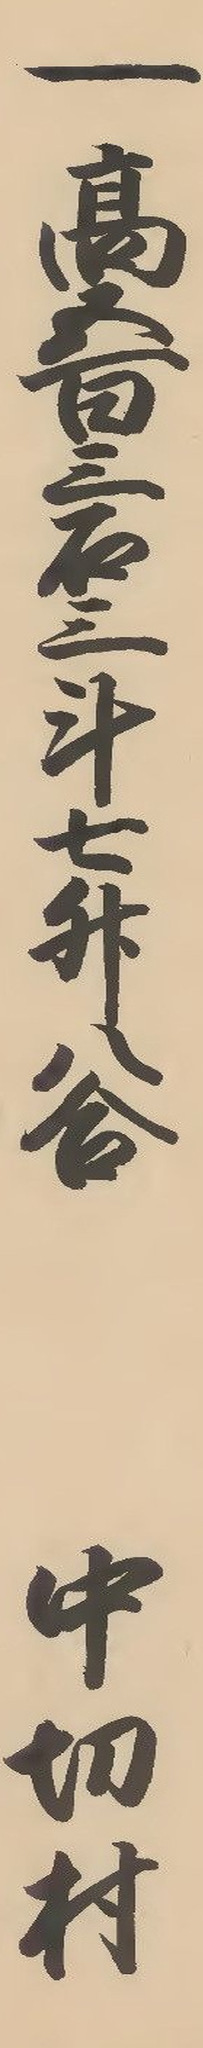一高五百三石三斗七升八合中切村
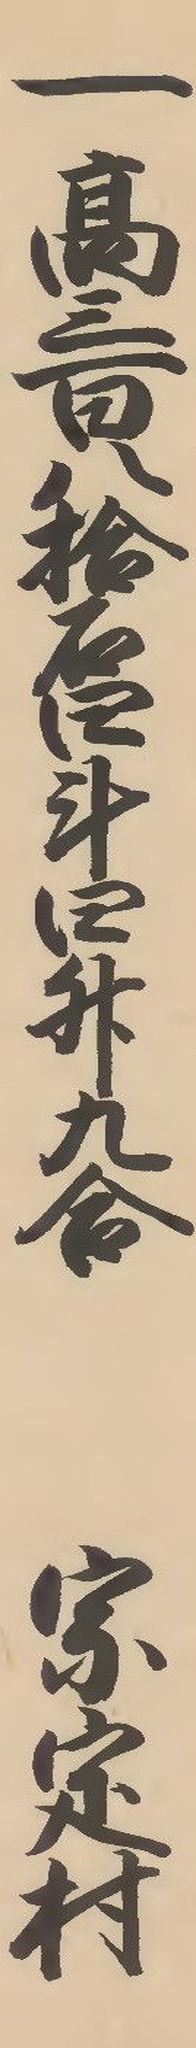一高三百八拾石四斗四升九合宗定村
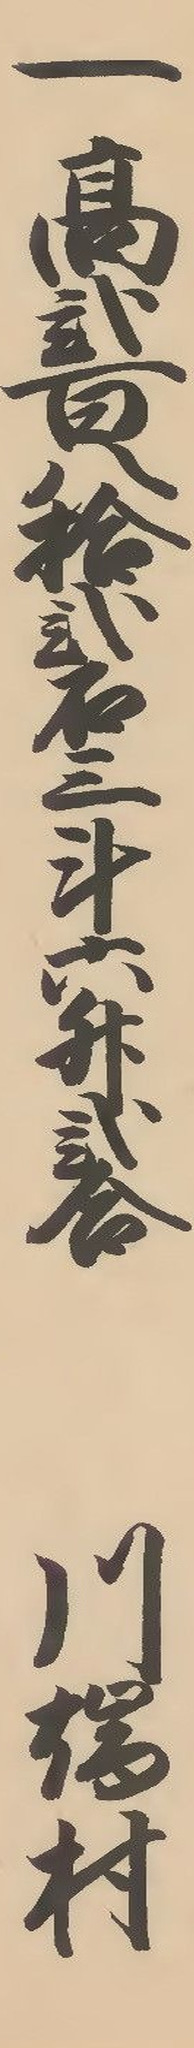一高弐百八拾弐石三斗六升弐合川端村
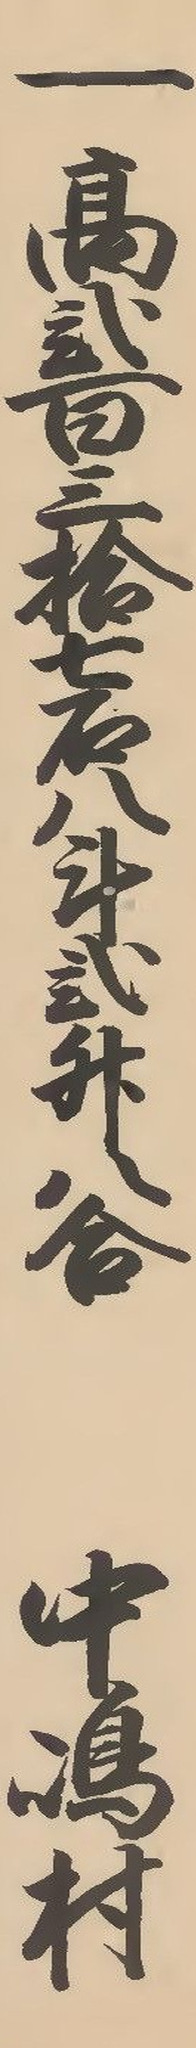一高弐百三拾七石八斗弐升八合中島村
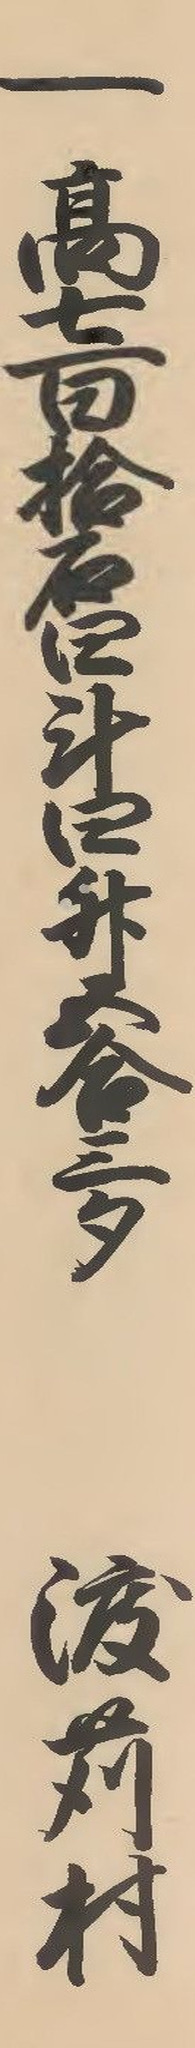一高七百拾石四斗四升五合三勺渡苅村
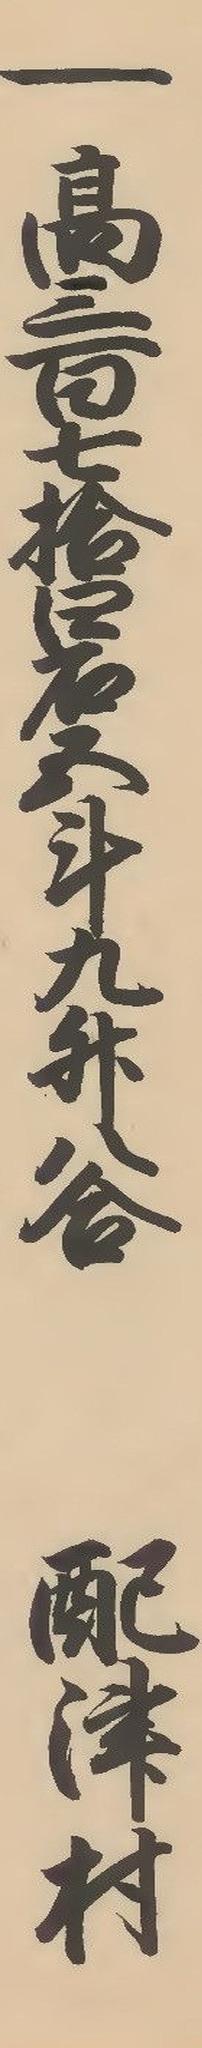一高三百七拾四石五斗九升八合配津村
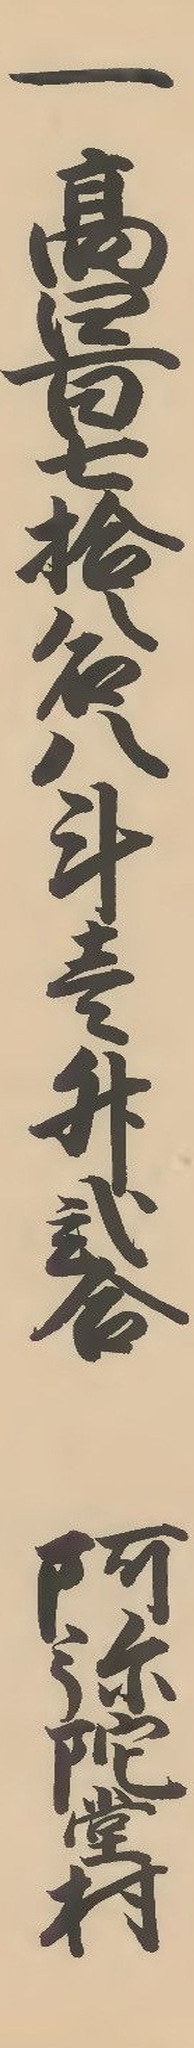一高四百七拾八石八斗壱升弐合阿弥陀堂村

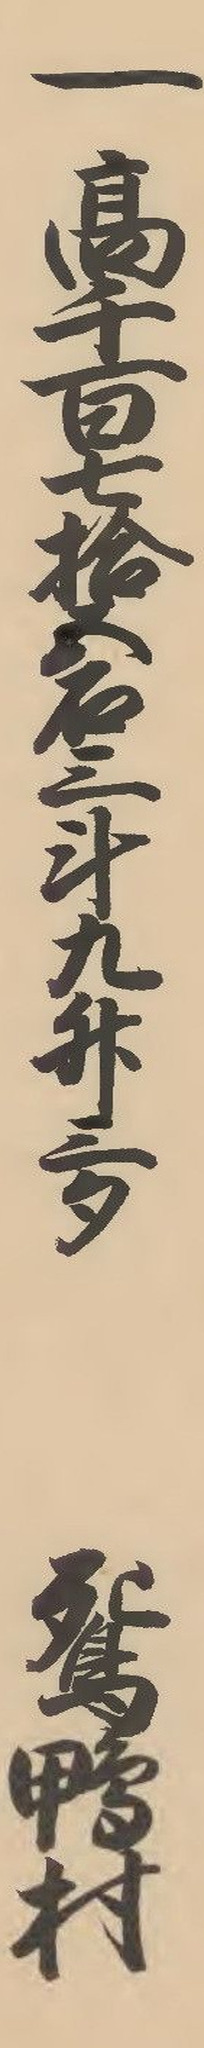一高千百七拾五石三斗九升三勺鴛鴨村
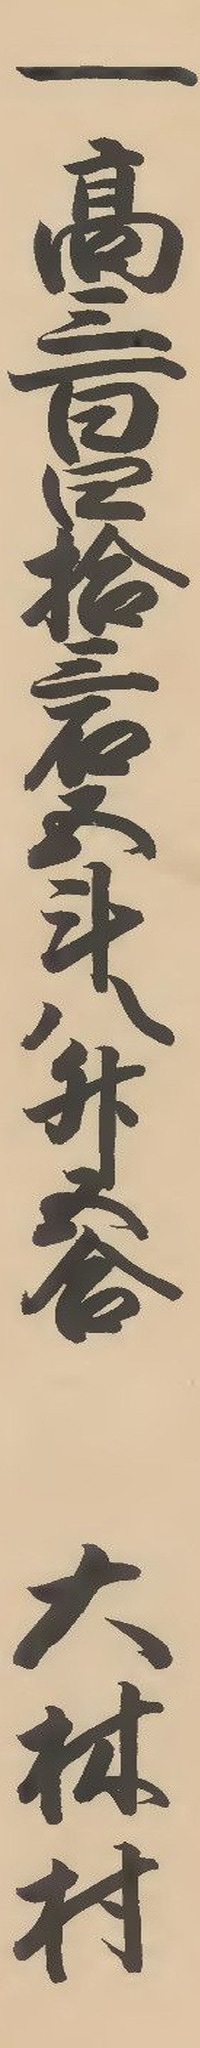一高三百四拾三石五斗八升五合大林村
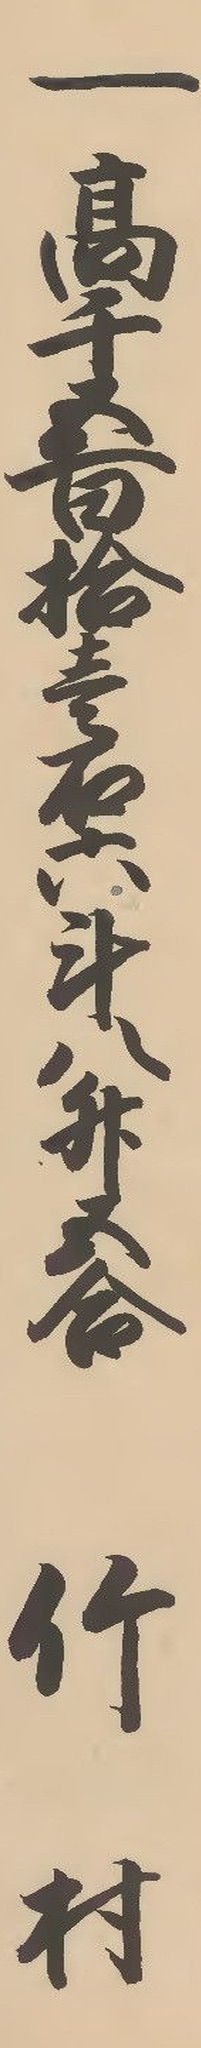一高千五百拾壱石六斗八升五合竹村
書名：三河国郷帳
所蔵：国立公文書館 National Archives of Japan
